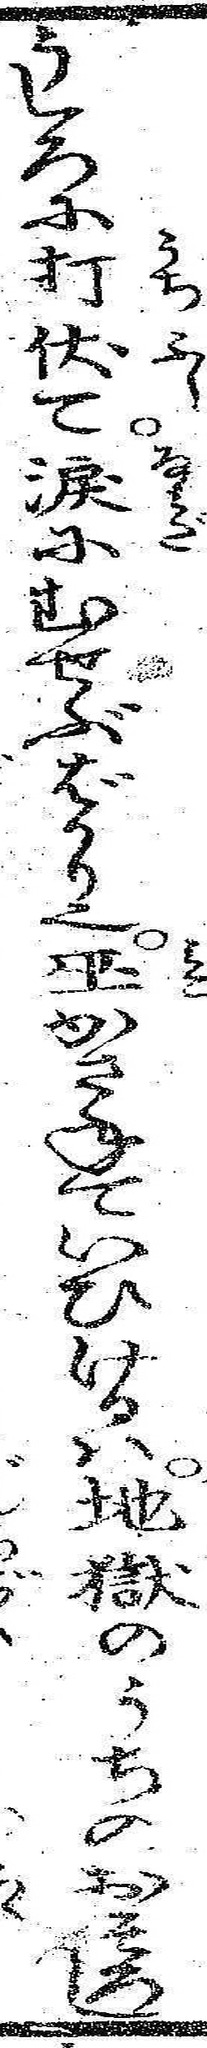うしろに打伏て。涙にむせぶばかり也。巫かさねていひけるは。地獄のうちのおそろし
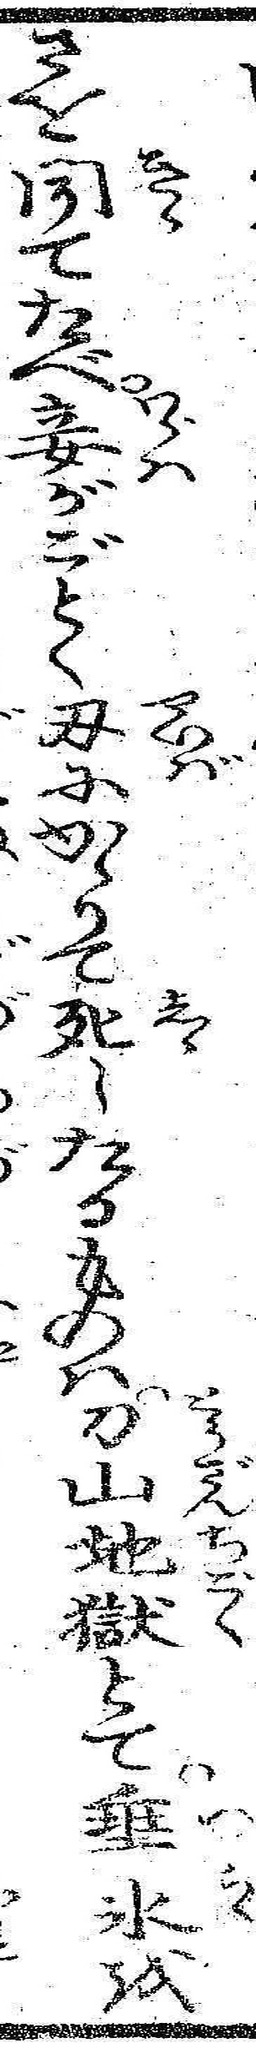さを聞てたべ。妾がごとく刃にかゝりて死したるものは。刀山地獄とて。垂氷を
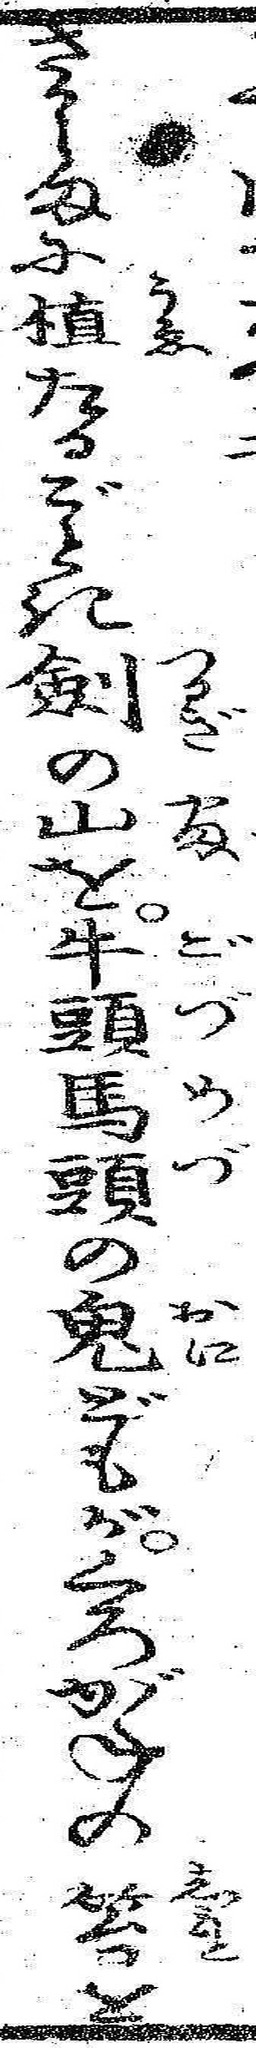さかしまに植たるごとき剣の山を。牛頭馬頭の鬼どもが。くろがねの笞を
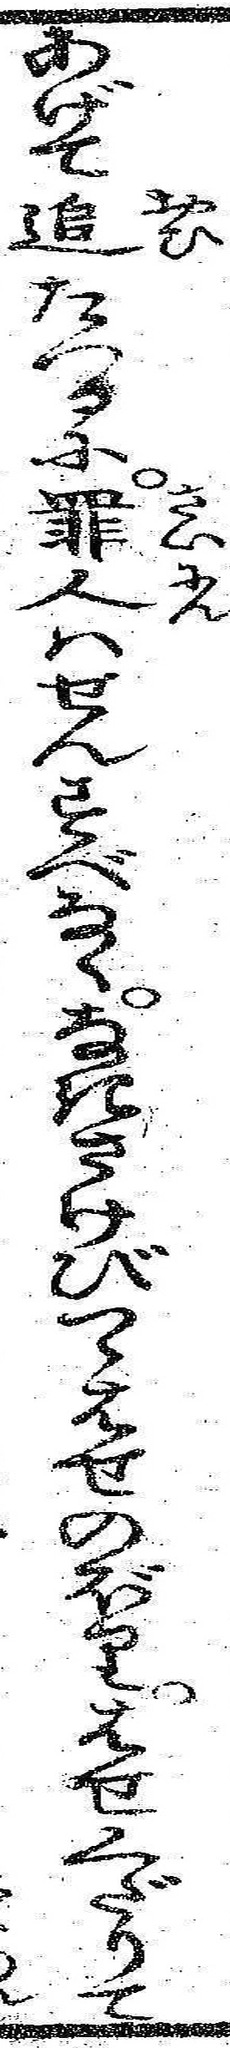あげて追たつるに。罪人はせんすべなく。なきさけびつゝはせのぼり。はせくだりて
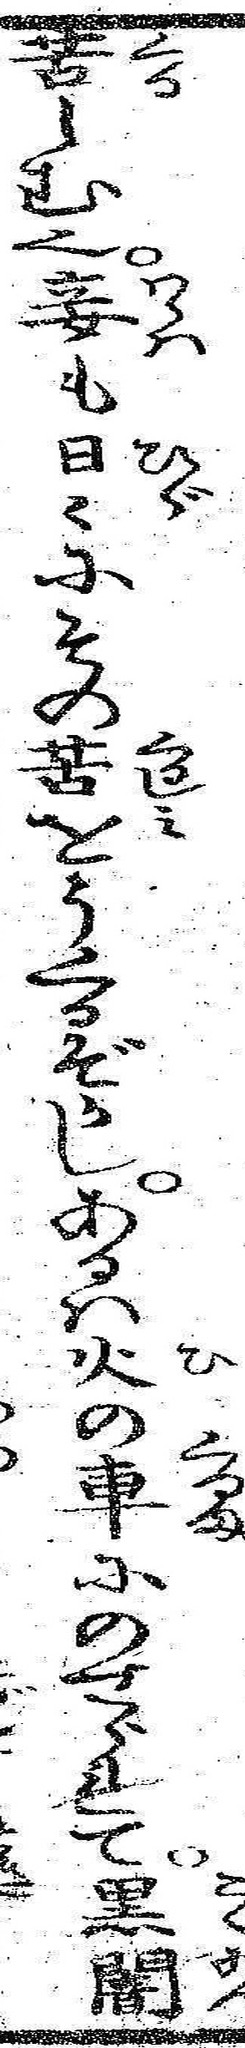苦しむ也。妾も日々にその苦をうくるぞかし。あるは火の車にのせられて。黒闇
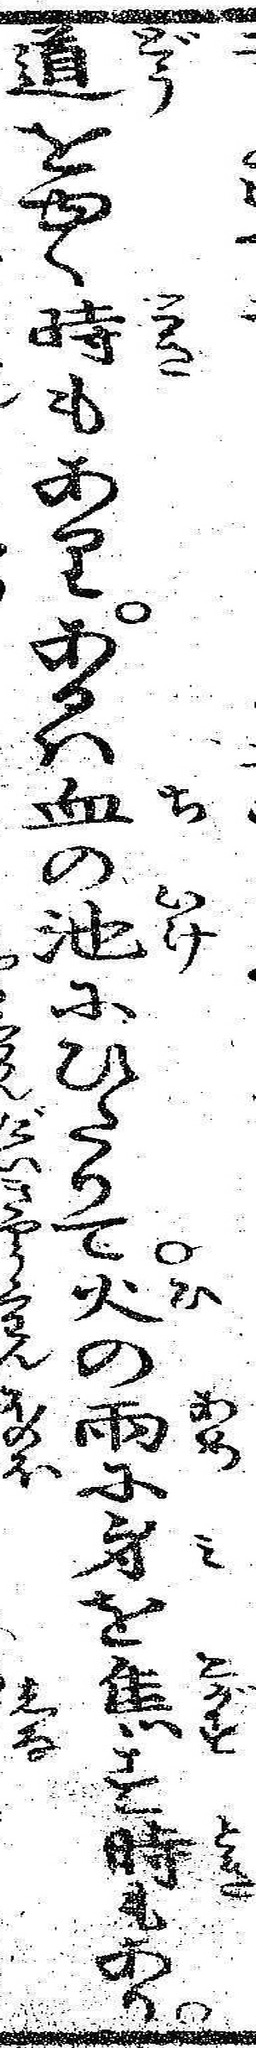道をゆく時もあり。あるは血の池にひたりて。火の雨に身を焦す時もあり。
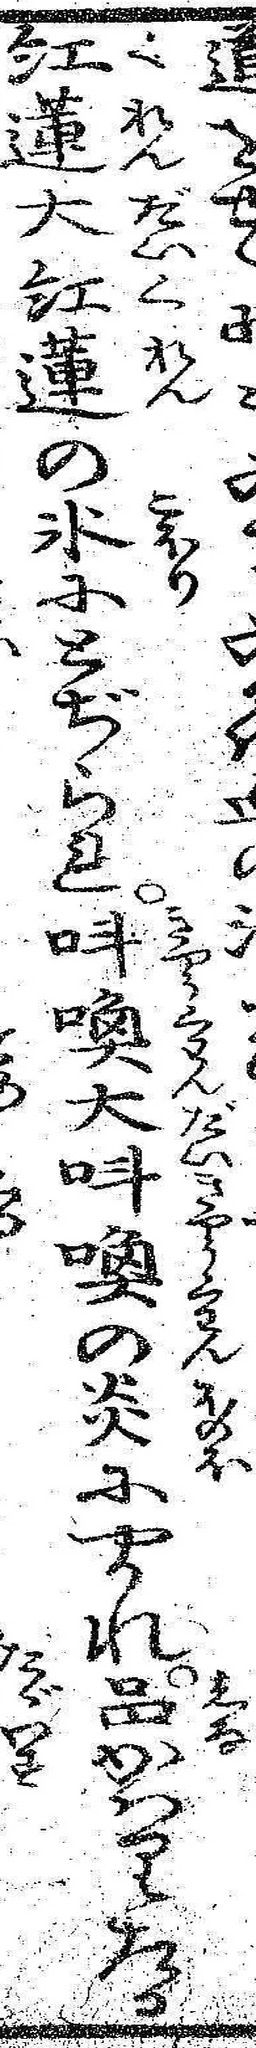紅蓮大紅蓮の氷にとぢられ。叫喚大叫喚の炎にやかれ。品かはりたる
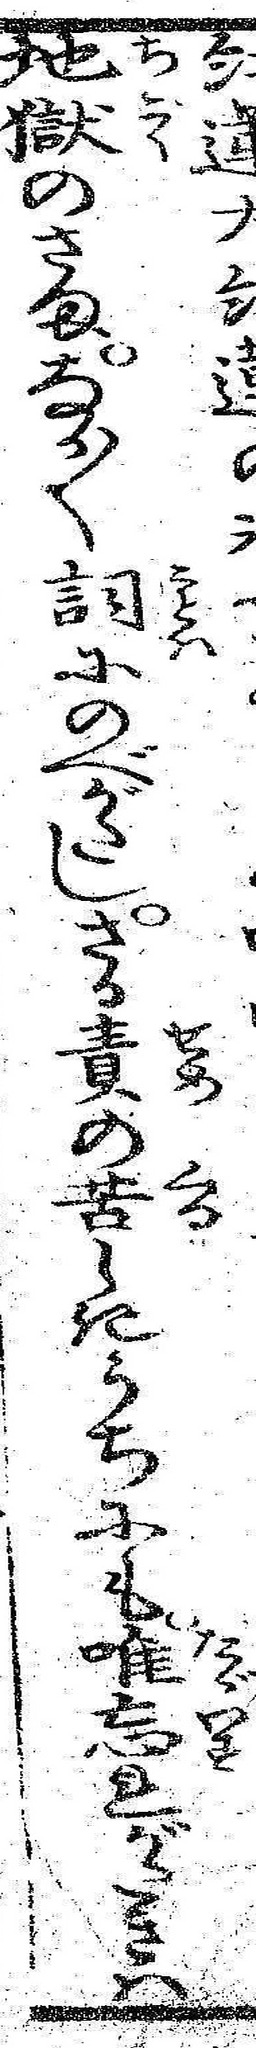地獄のさま。なか〳〵詞にのべがたし。さる責の苦しきうちにも。唯忘れがたきは

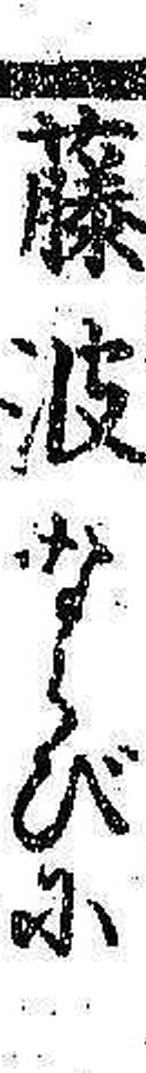藤波ならびに
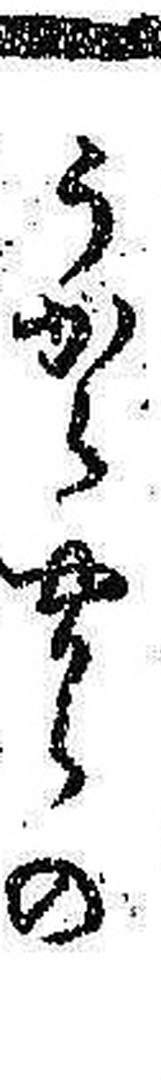うからやからの
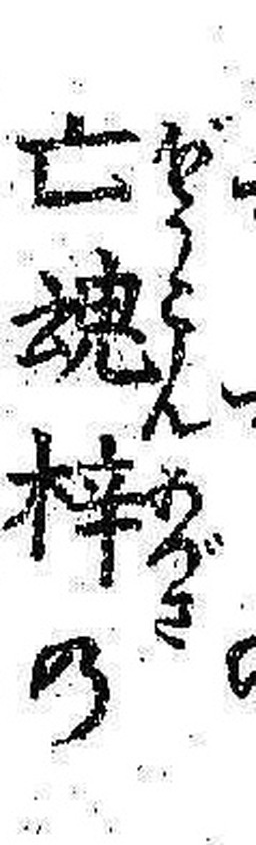亡魂梓の
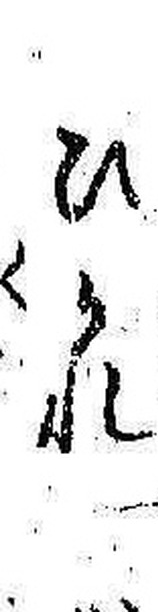ひかれ
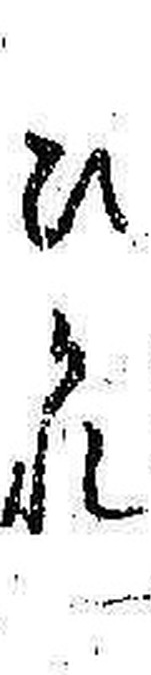ひかれ
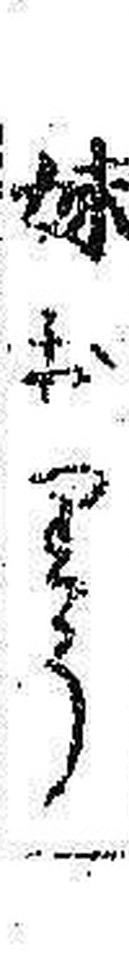妹おりう
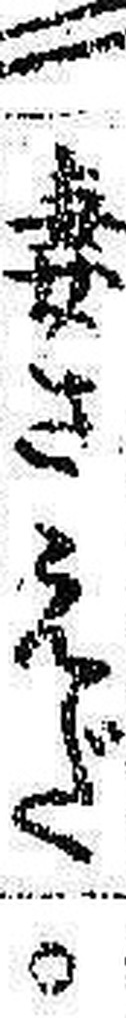妻さえだ
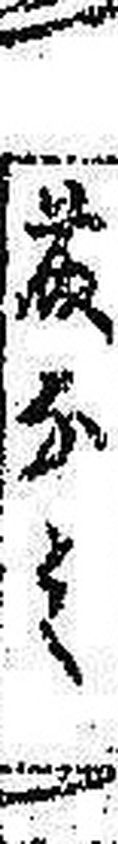藤なみ
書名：昔話稲妻表紙
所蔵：国文学研究資料館
